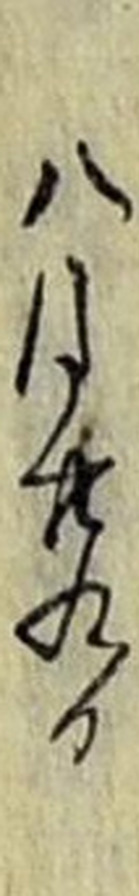八月廿九日
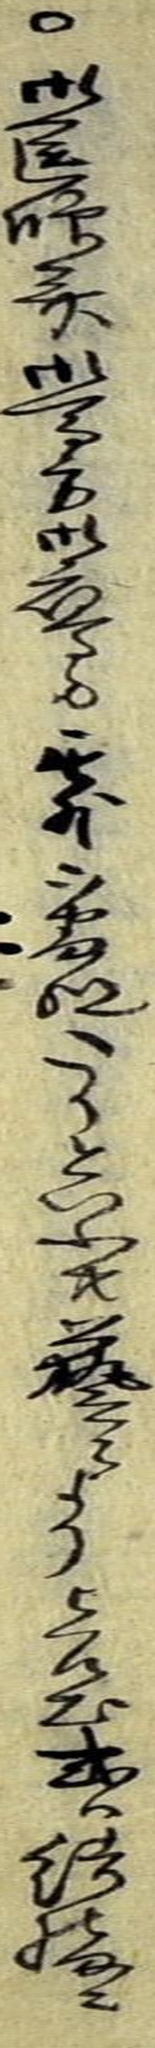〇御医師并御馬方御鷹方其外御番組たりといふ共芸ニより被召出或ハ結構ニ
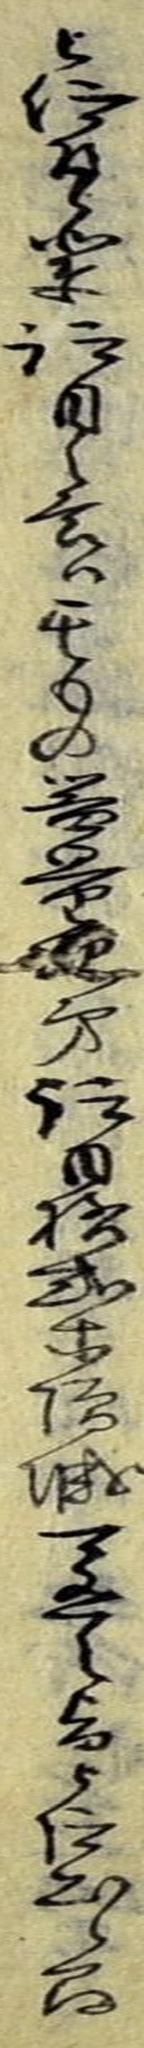被仰付候輩跡目之節ハ其もの器量次第跡目格式等増減可有之旨被仰出候間

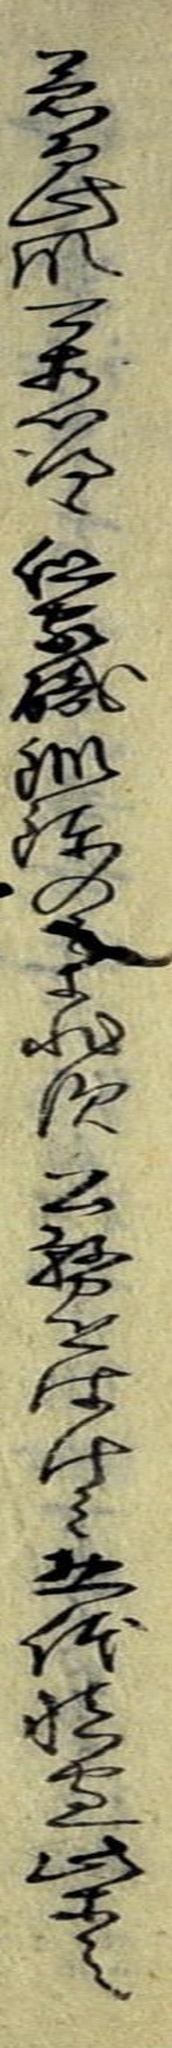兼而此段可相心得候但家職鍛錬のみに非す公務をはけみ惣体慎宜此等之
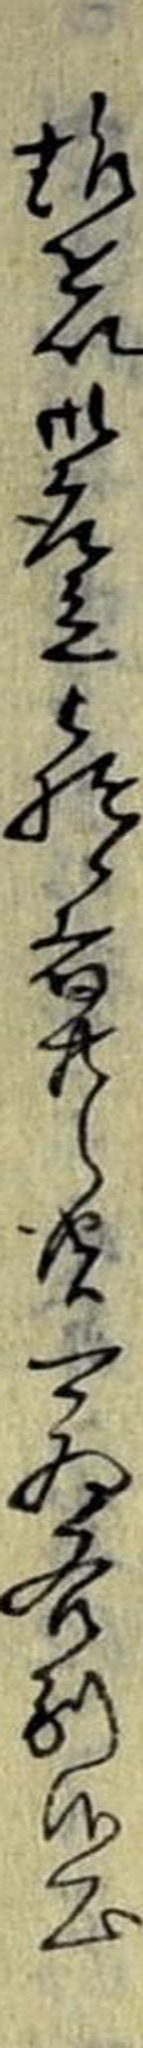趣を以御取立被遊候者共之儀ハ可為各別候以上
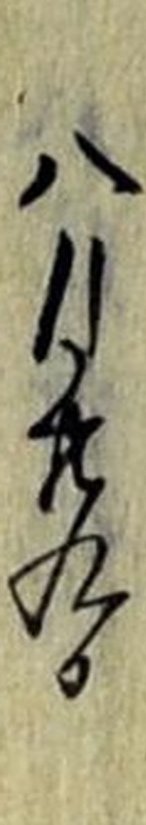八月廿九日
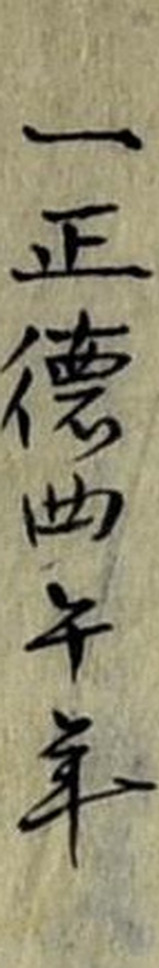一正徳四午年
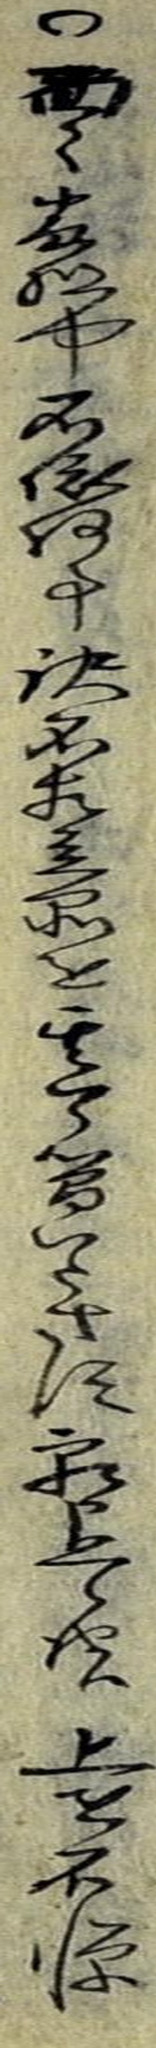〇面々番組中不依何事訳不相立品を其了簡いたさす願申上候儀ハ上を不憚
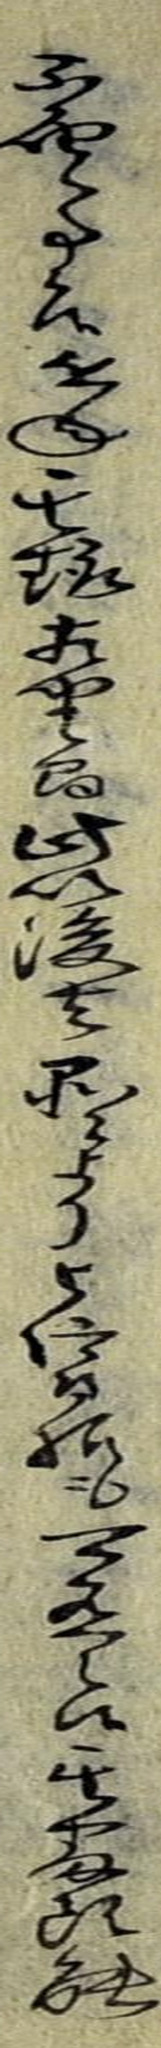不届候事ニ候近年其趣相聞候間此以後者品ニより被仰付様も可有之候其番頭能
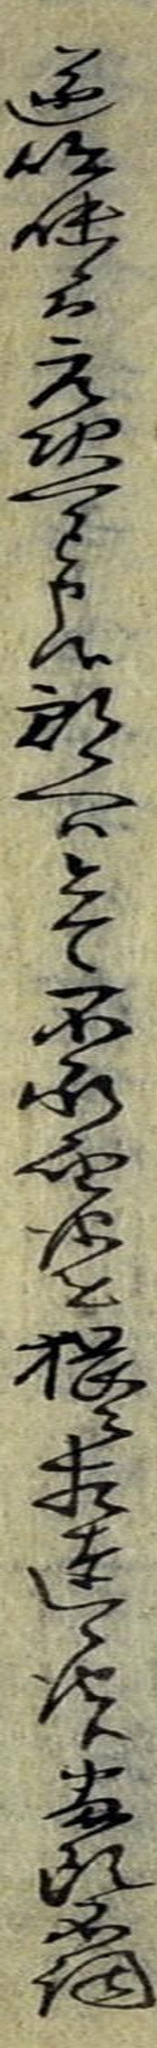遂吟味候而取次可被申候願候ヘハとて不承届儀を猥ニ相達候儀ハ番頭不調
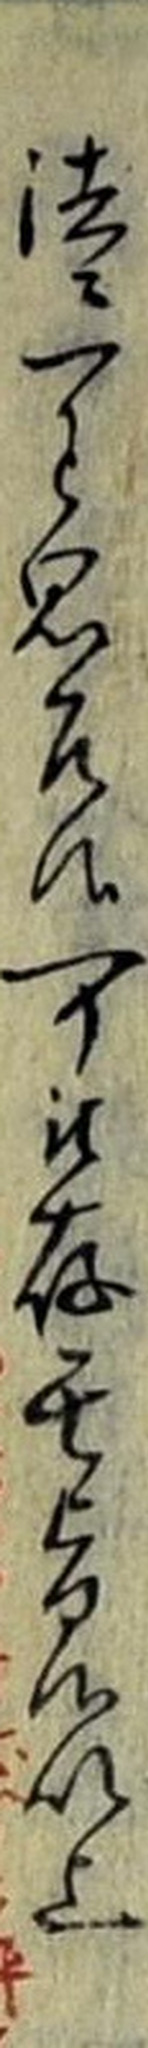法ニ可被思召候可被存其旨候以上
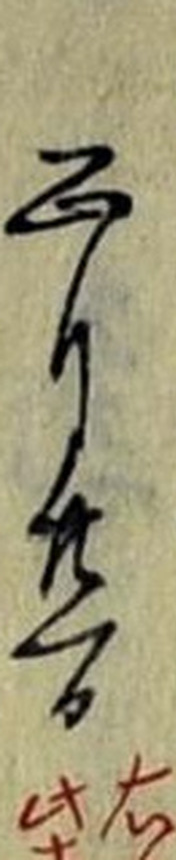正月廿一日
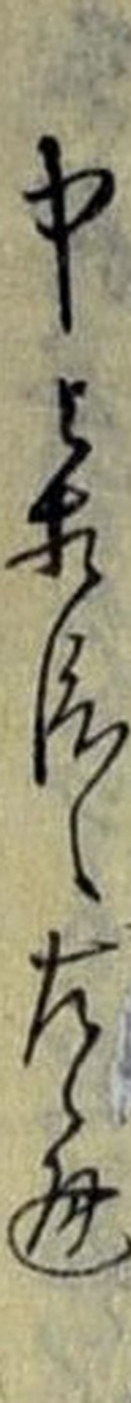中被相渡候左之通
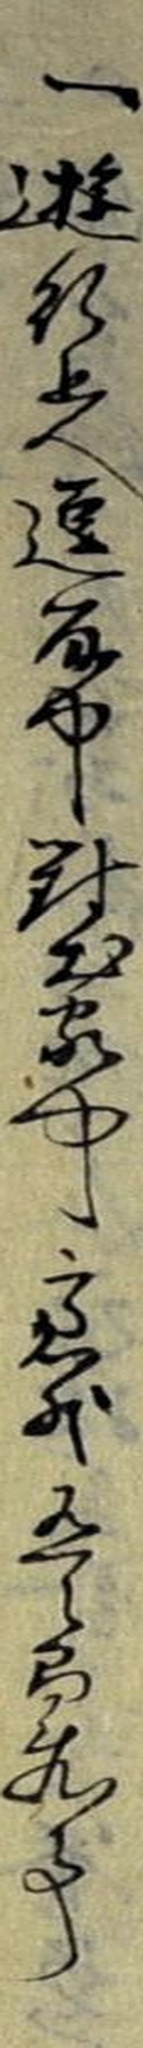一遊行上人逗留中対出家中慮外有之間敷事
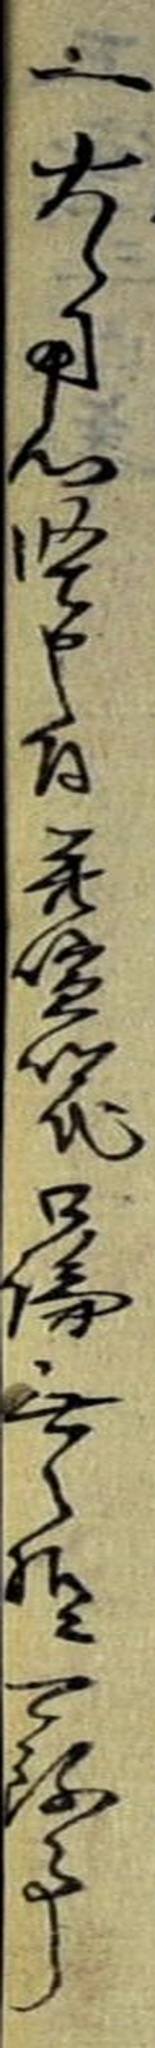一火之用心堅申付并喧嘩口論無之様ニ可致事
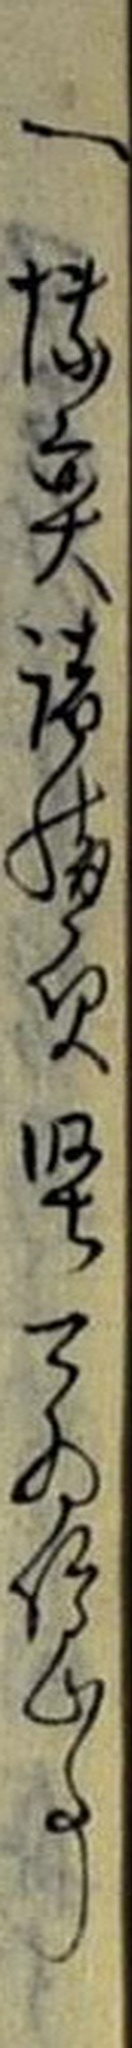一博奕諸勝負堅可為停止事
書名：命令之部 一
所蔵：福井県文書館 Fukui Prefectural Archives
